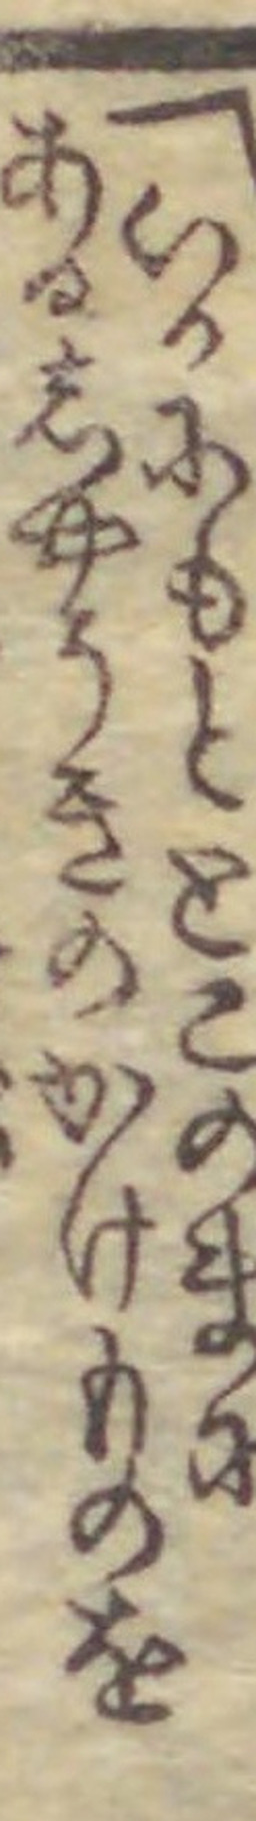あるしやうきのかけものを
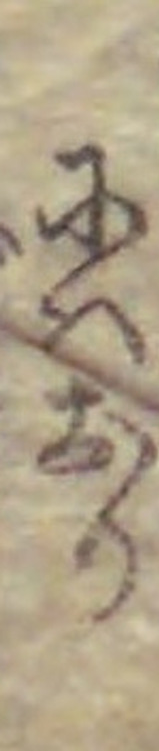にはおり
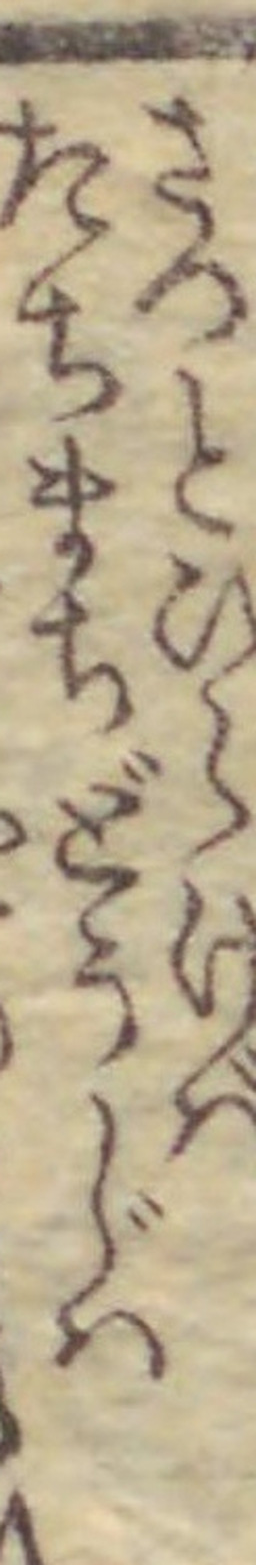たちまちどうじは
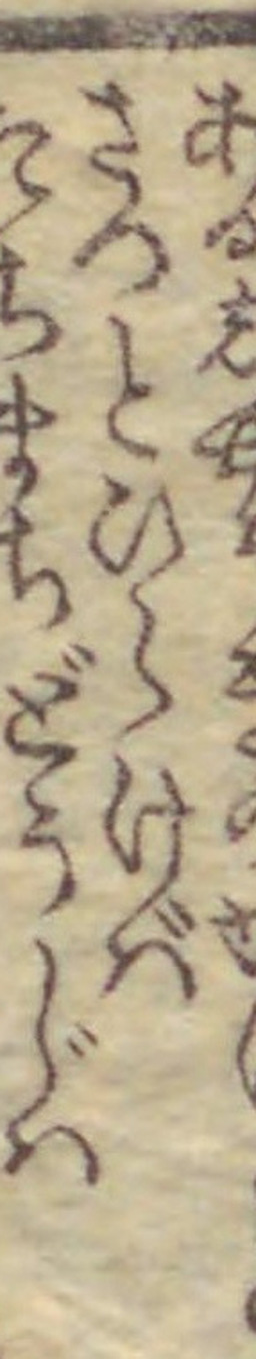さつとひらけば
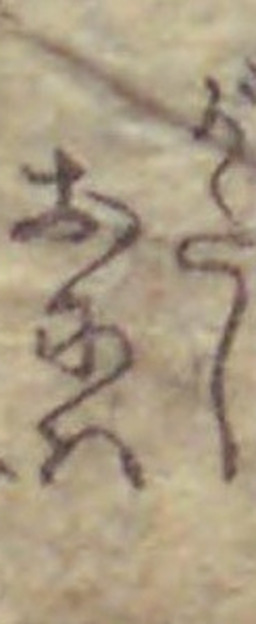おには
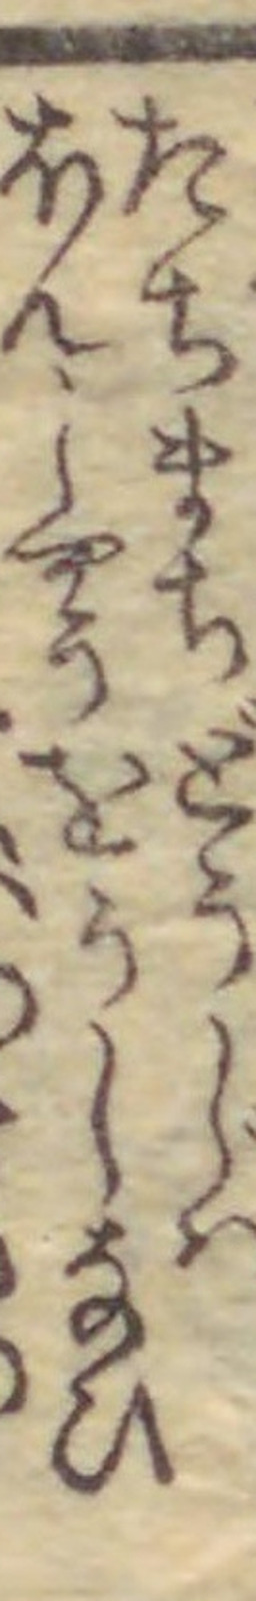ほんしやうをうしなひ
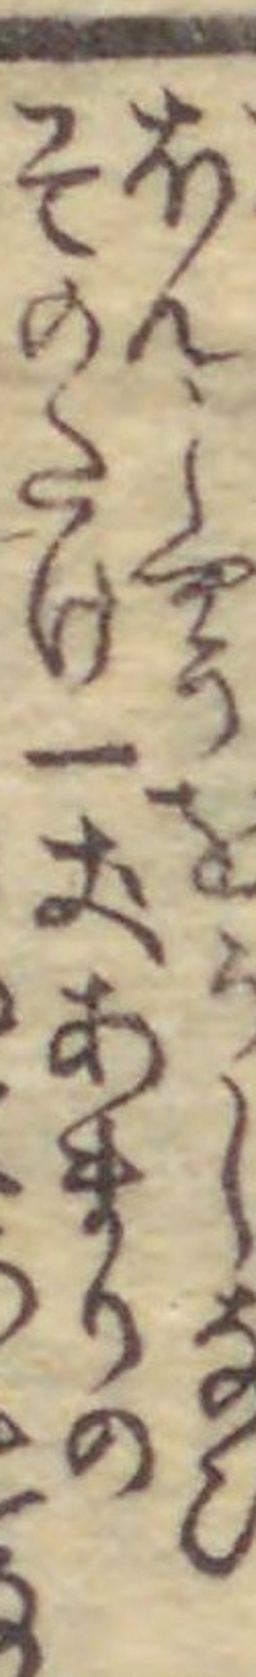そのたけ一丈あまりの
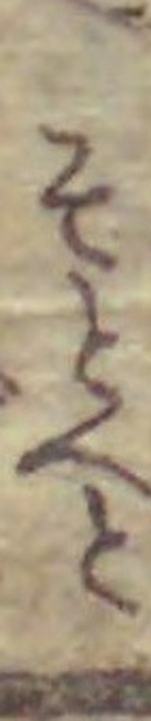そとへと
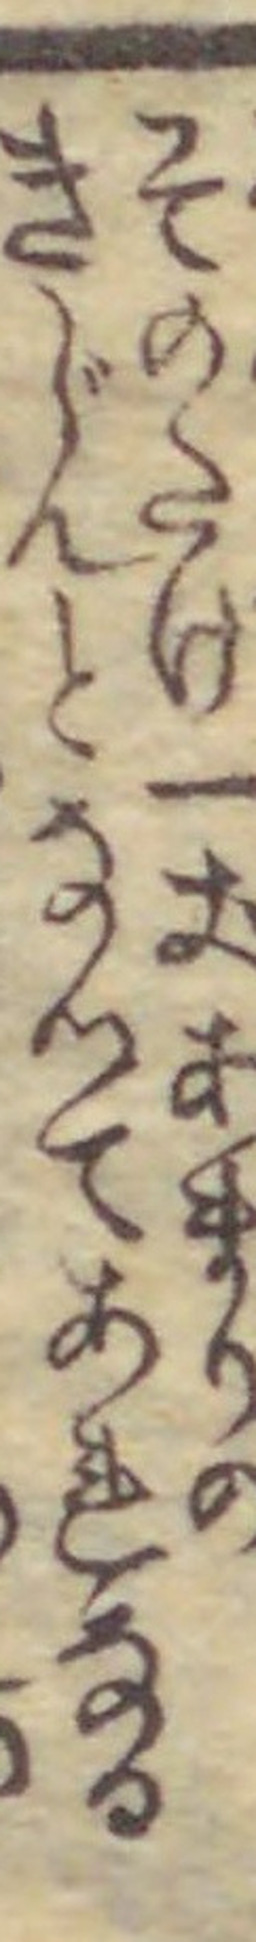きじんとなつてあれなる
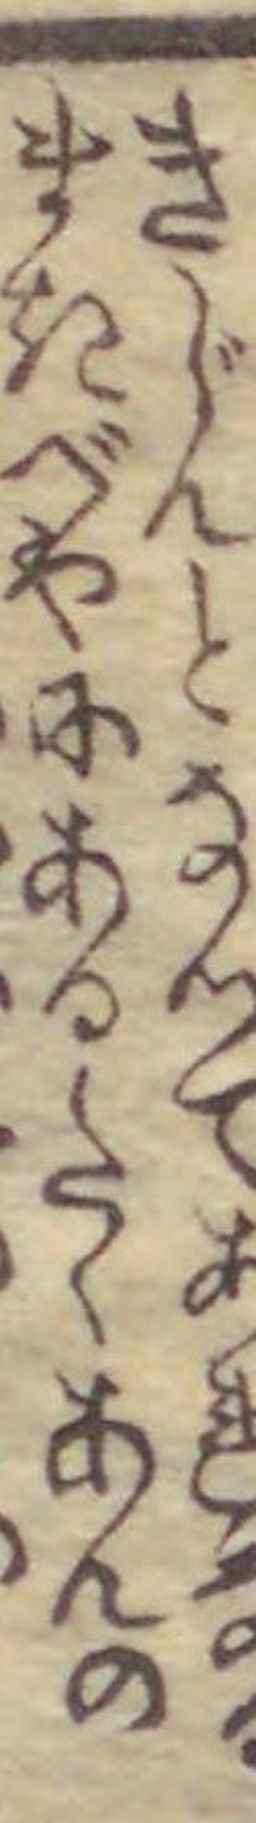まきべやにあるたくあんの
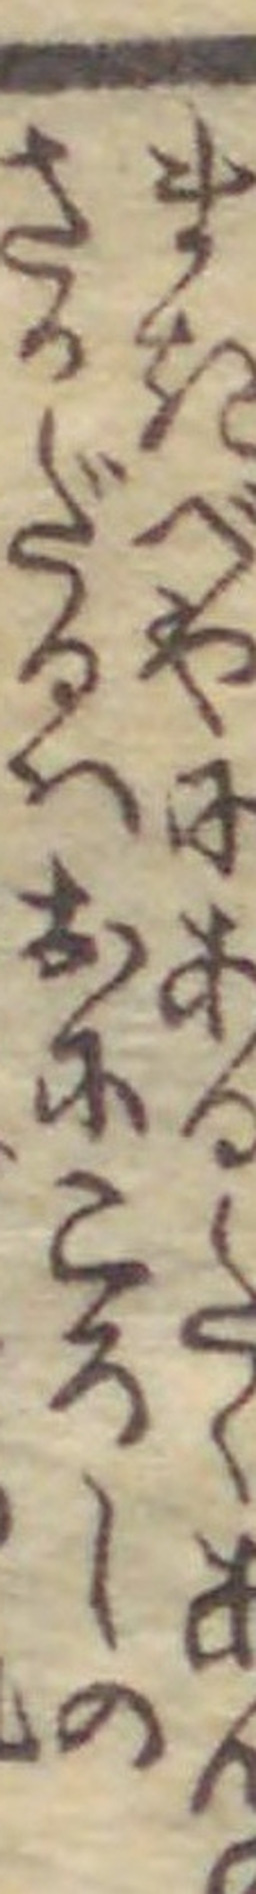さかだるはおにころしの
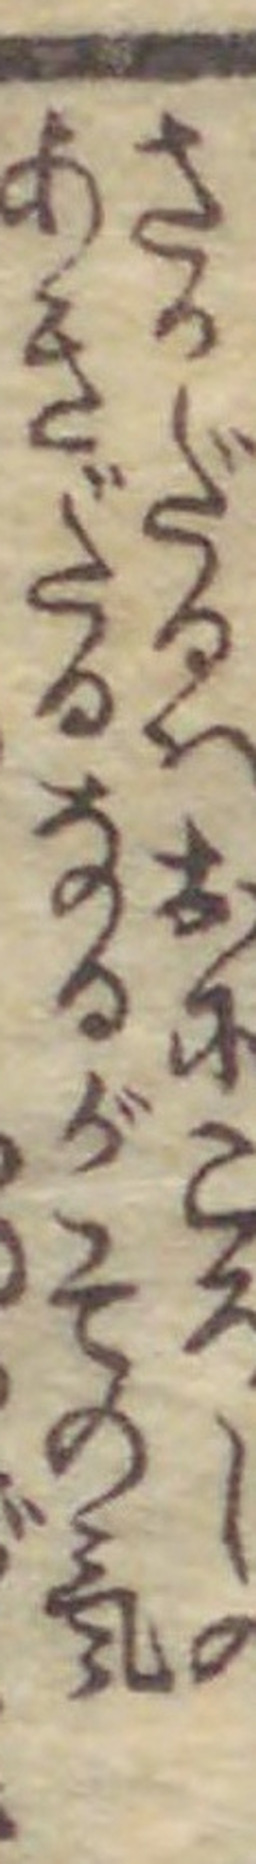あきだるなるがその気
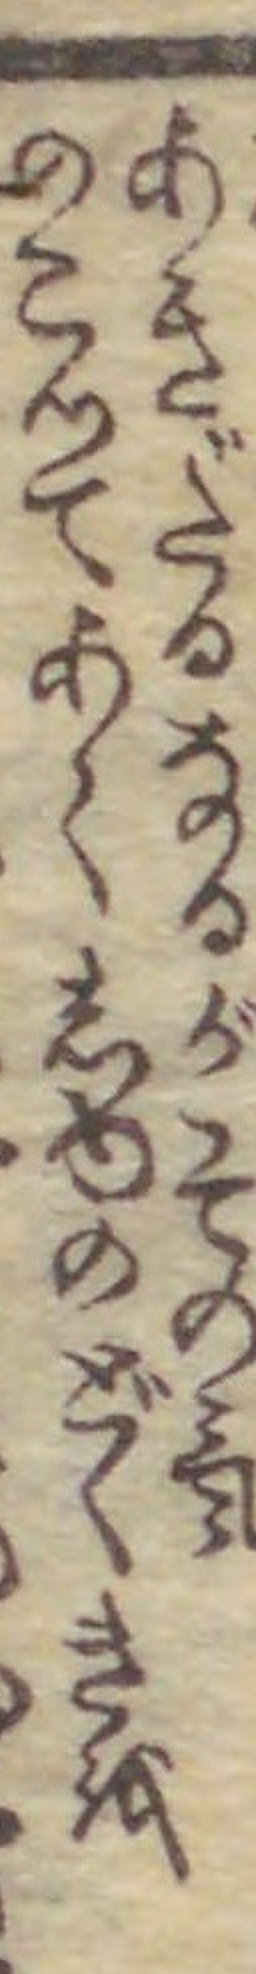のこつてあくしゆのどくきを
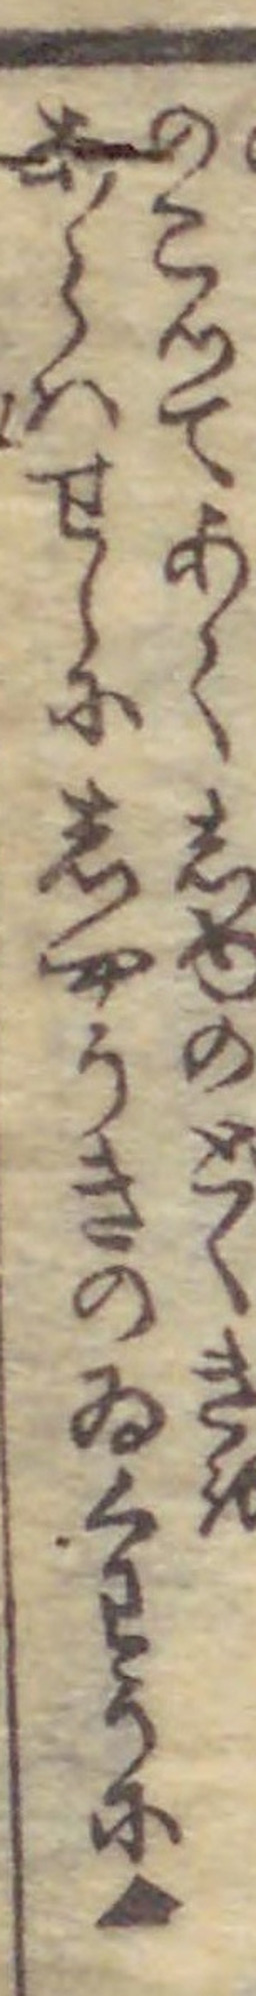あらはせしにしやうきのゐくわうに▲

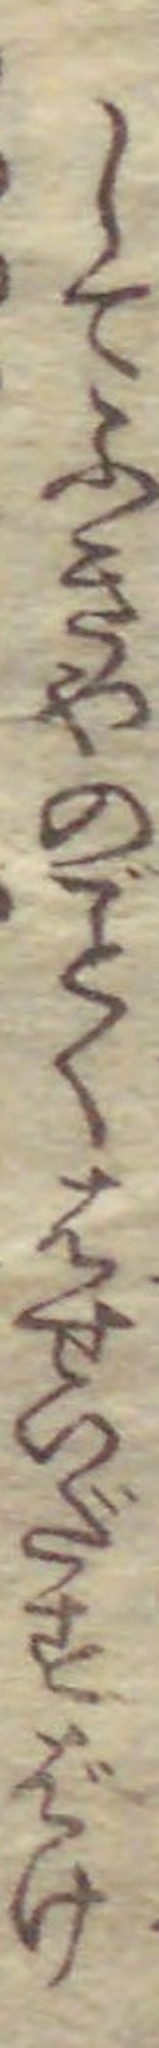してふきやのごとくはせいだすばけ
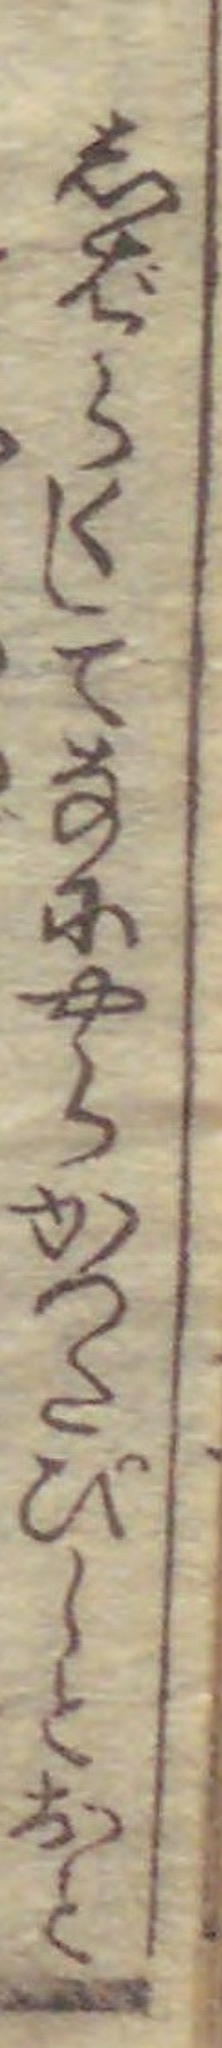しばらくしてなにやらかつたびしとおと
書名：大時代唐土化物 3巻. 曽我太夫染
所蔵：国立国会図書館 National Diet Library, JAPAN
